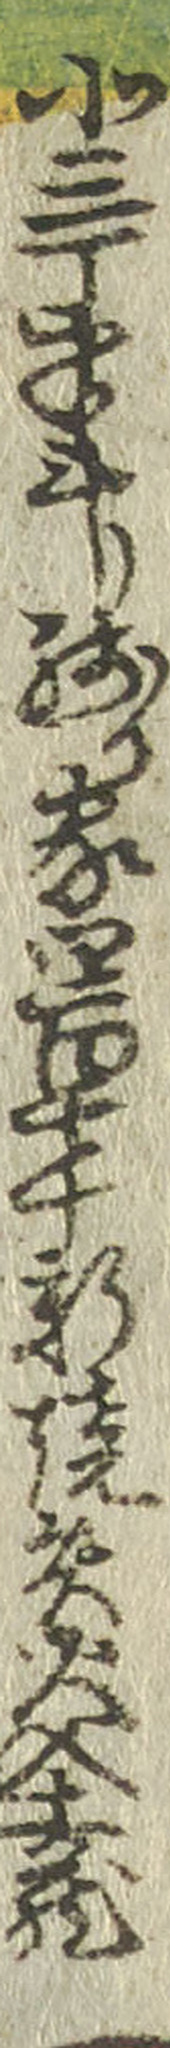北三丁半斗り残り家四百七十軒焼失火入土蔵
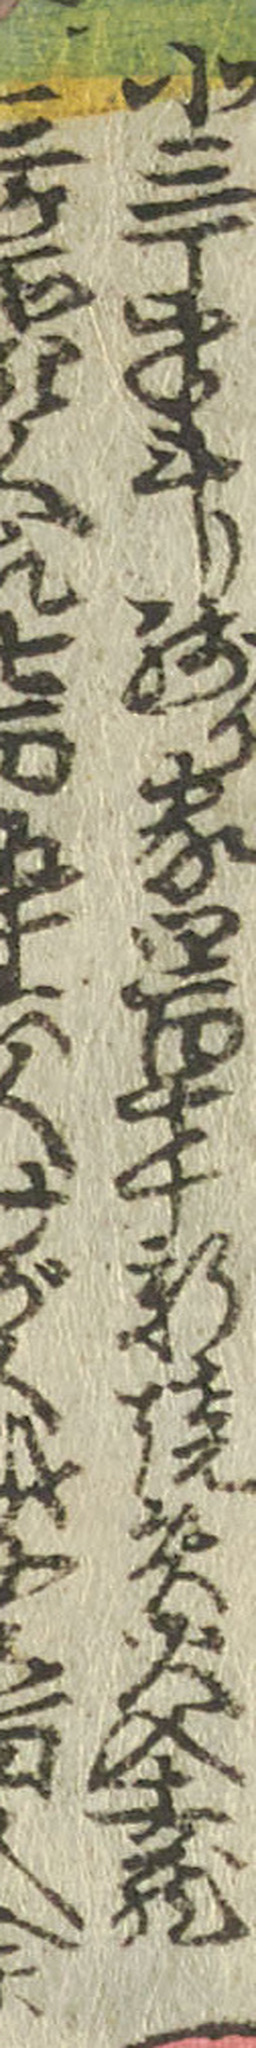三ヶ所死人凢七百五十六人けが人弐千五百人余
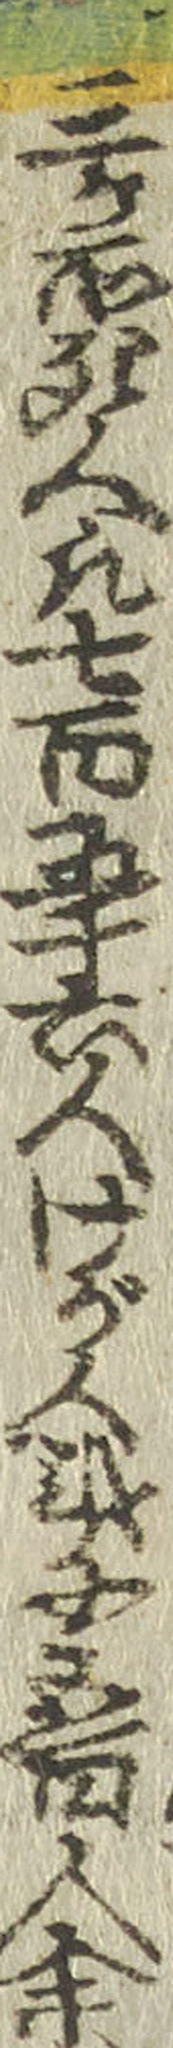三ヶ所死人凢七百五十六人けが人弐千五百人余
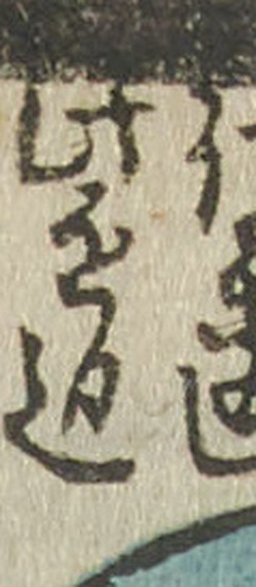此近辺
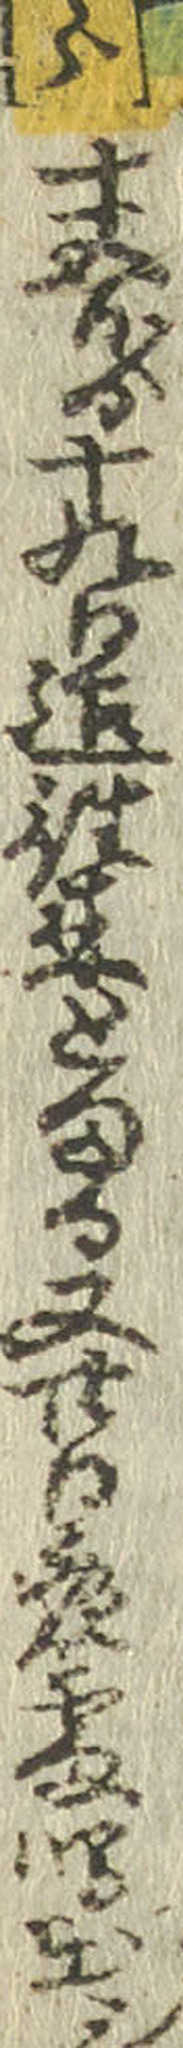十五日ゟ十九日迄往来とまる又廿日夜雷鳴出シ
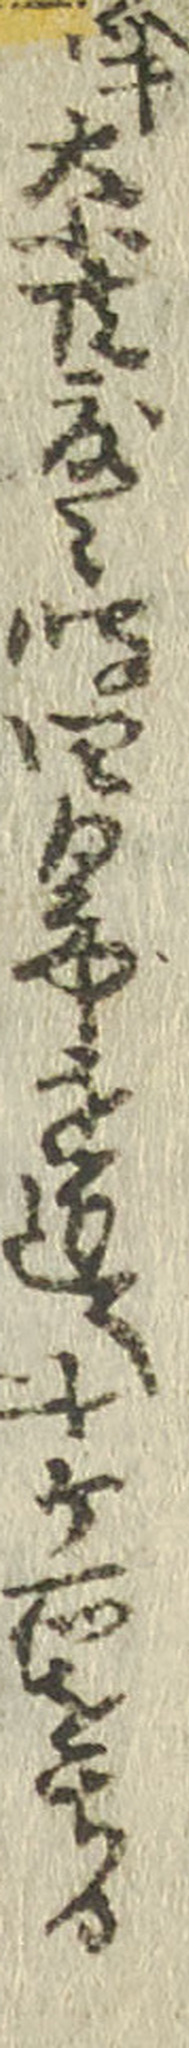大小共度〻鳴四日市近辺へ十ヶ所をちる
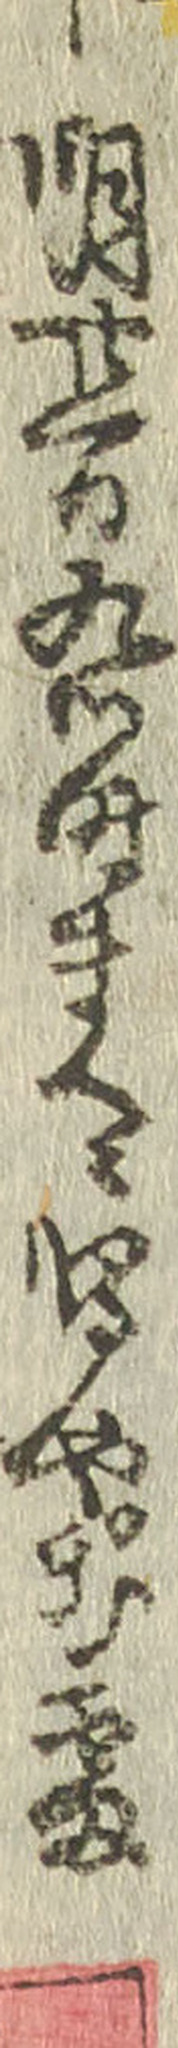明廿一日九ツ時まへニ鳴やむ雷
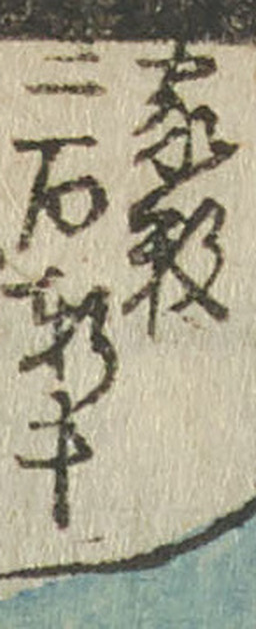二百軒斗
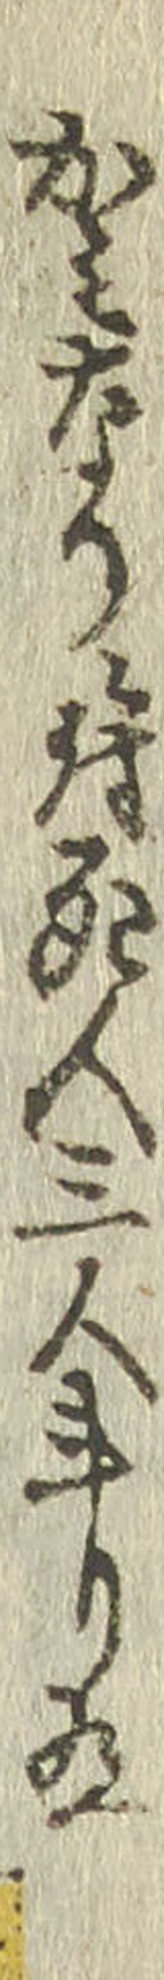かミなりニ付死人三人斗り有
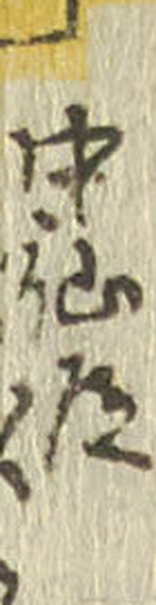中仙道
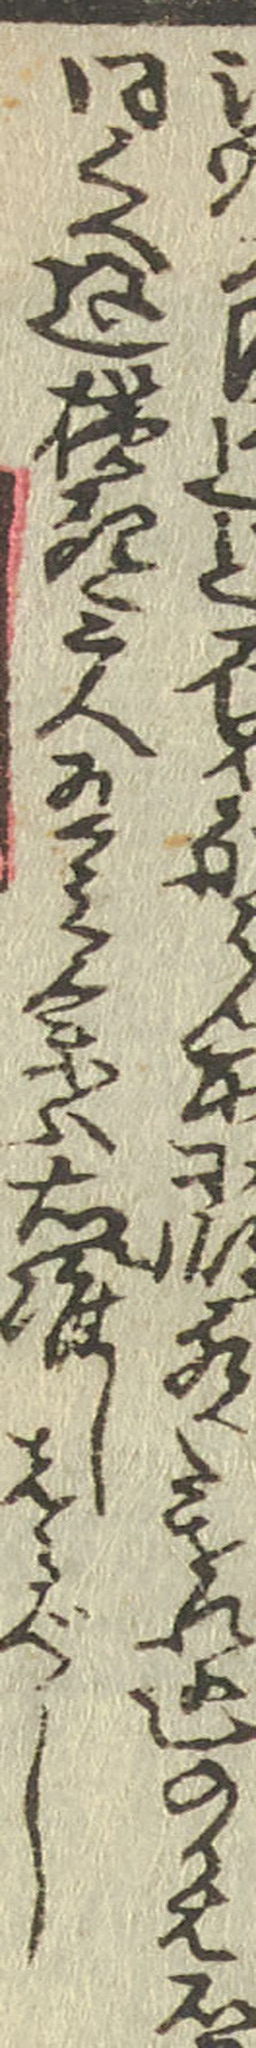同くへ込横死三人有之余りハ大ニ推ししるべし
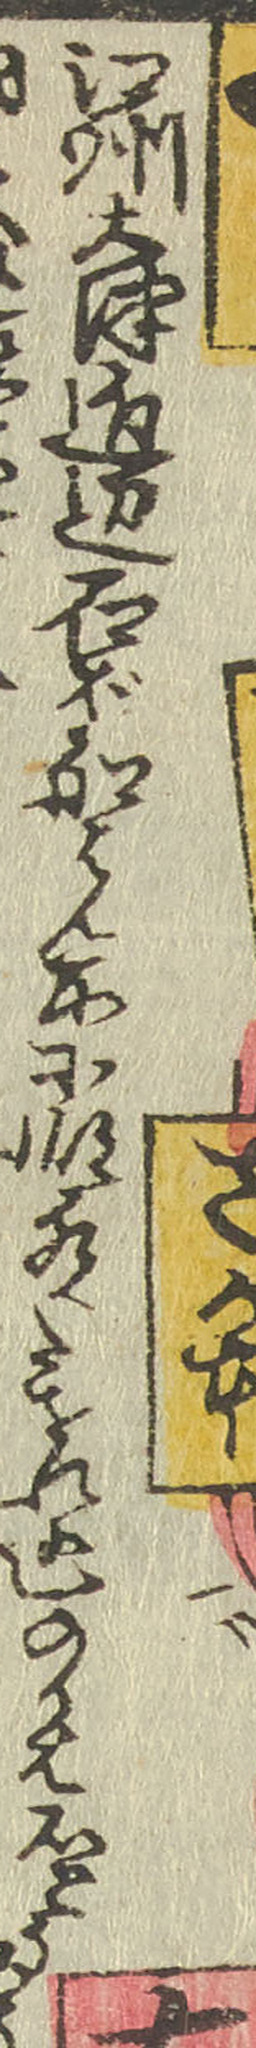江州大津近辺船はん所に水たをれ込のかれ石とうろう
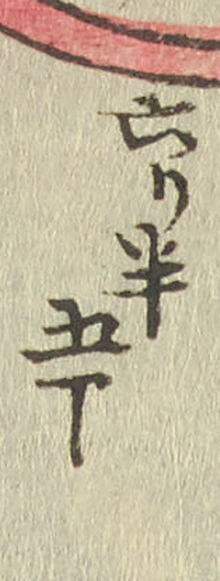六り半五丁
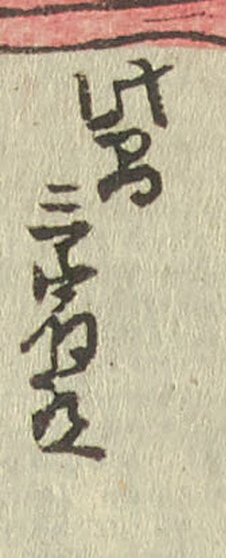此間三宿有
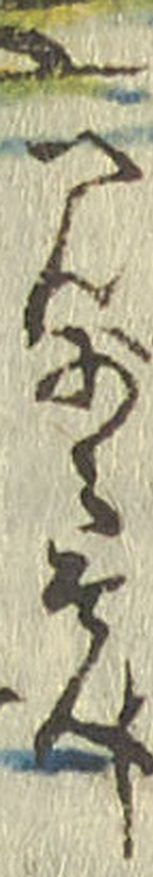へん少〻そんじ
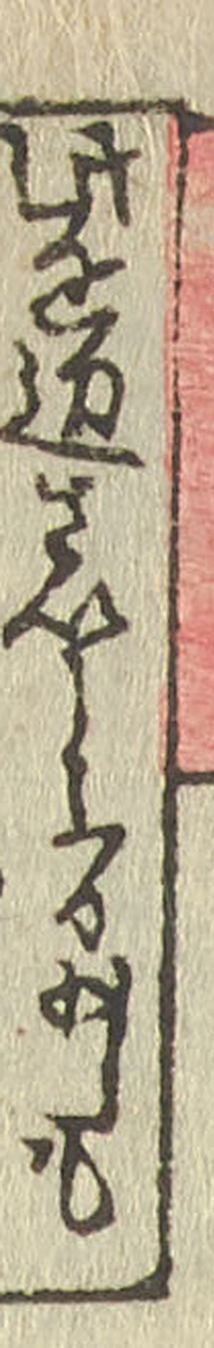此近辺さいしよゟ少しも
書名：大地震早引方角附
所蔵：東京大学総合図書館 General Library in the University of Tokyo, JAPAN
